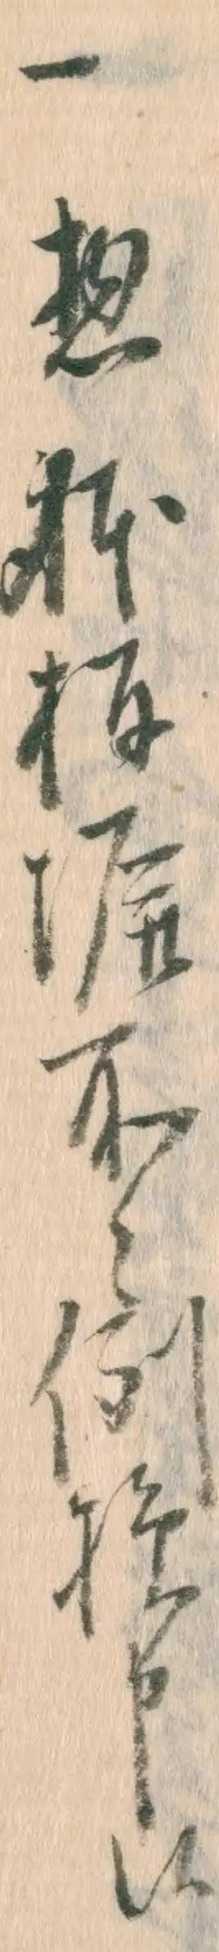一惣体板塀所〻倒損申候
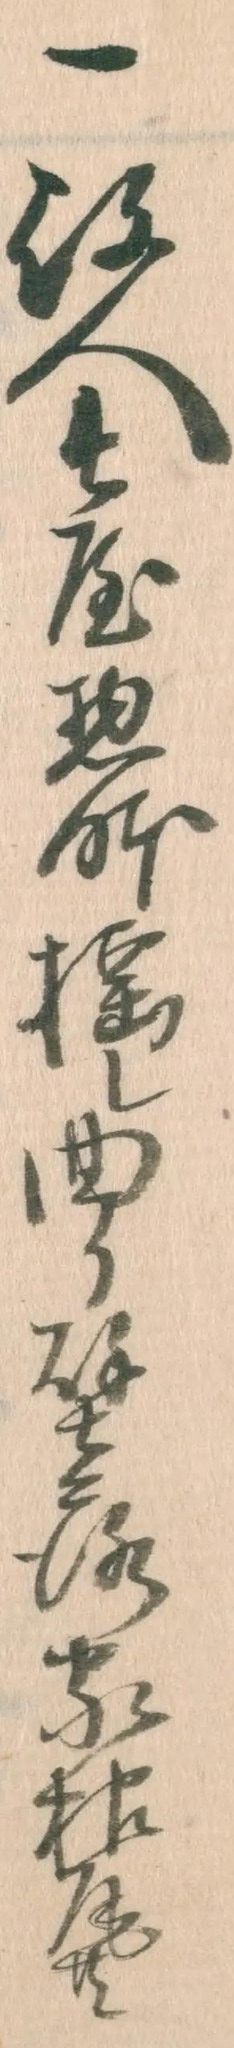一役人長屋惣体揺れ曲り壁落家根瓦共
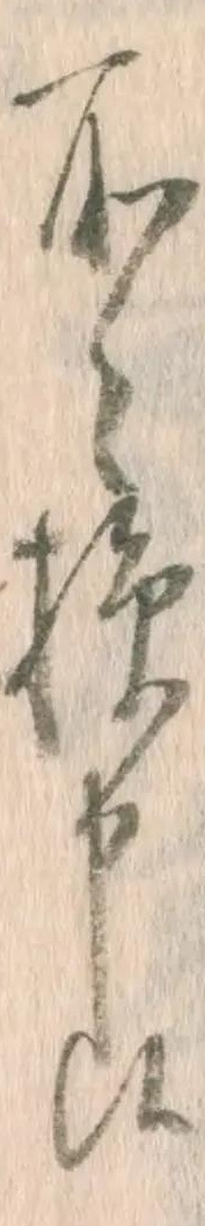所〻損申候
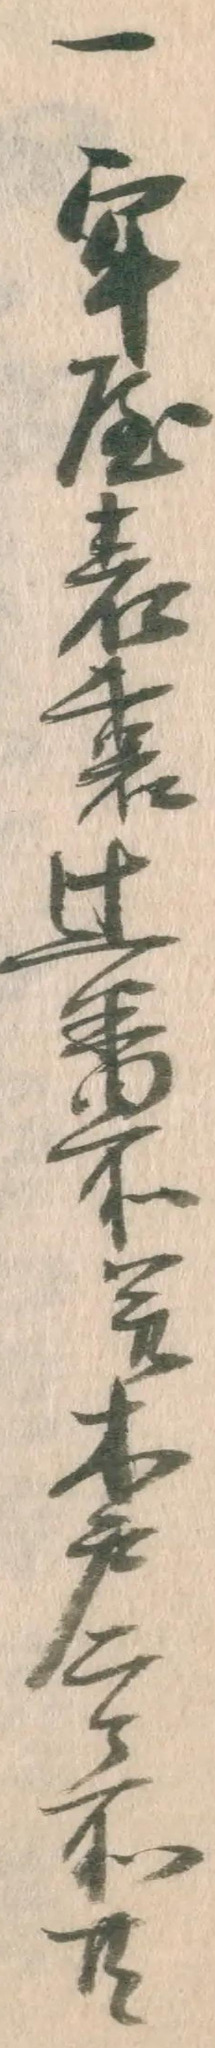一牢屋表裏辻番所幷木戸弐ケ所共
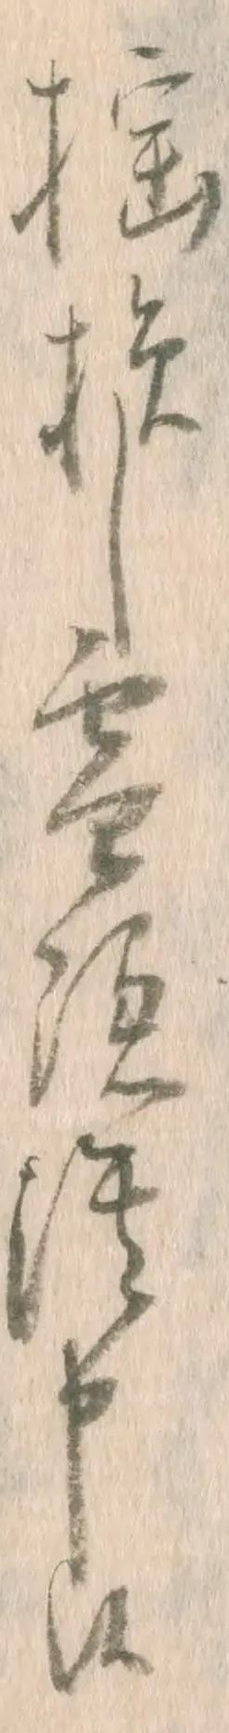揺損し雪隠潰申候
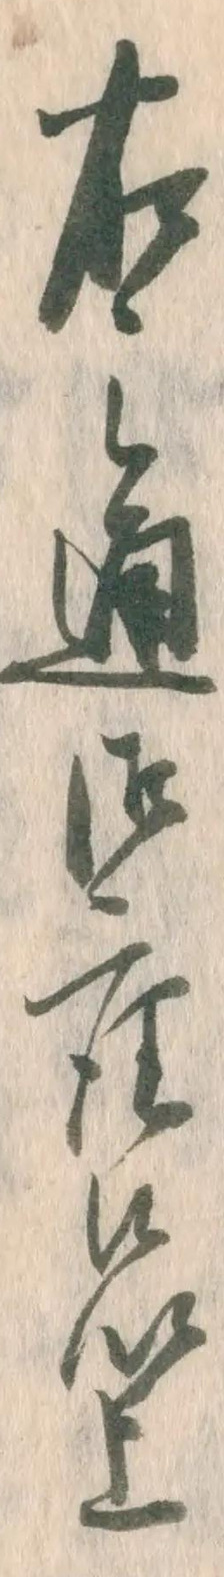右之通御座候以上

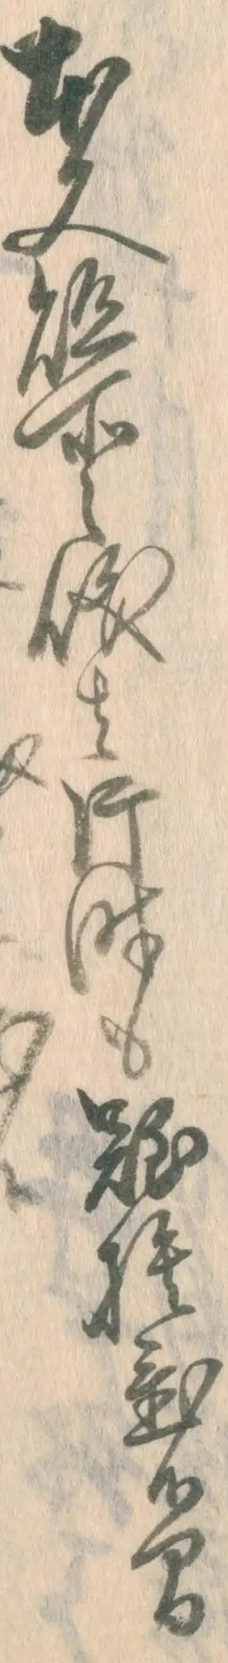本文賄所之儀は片時も難捨置候間
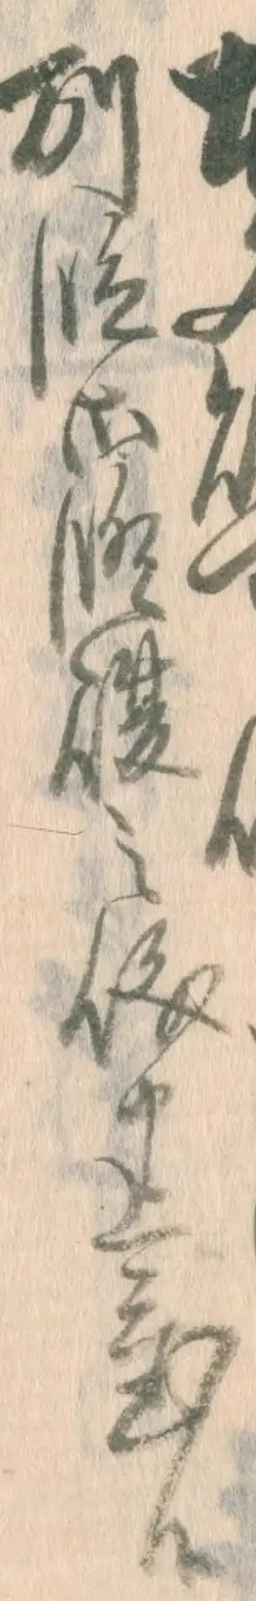別段御修復之儀申上置候
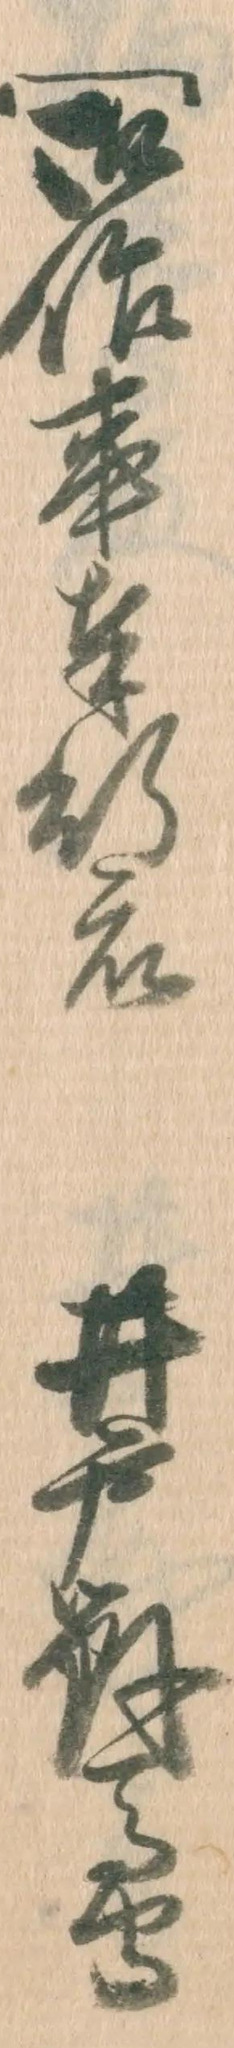│[御作事奉行衆井戸対馬守
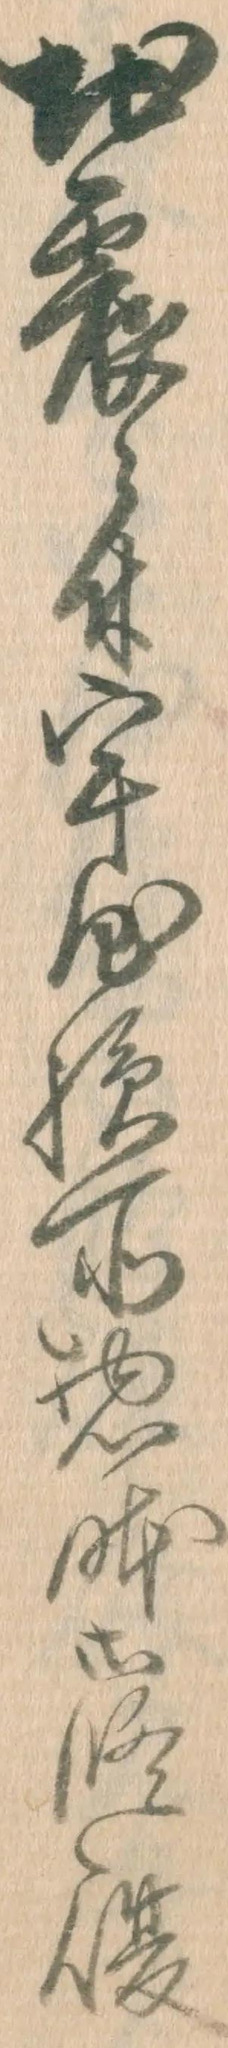地震ニ付牢屋損所惣体御修復
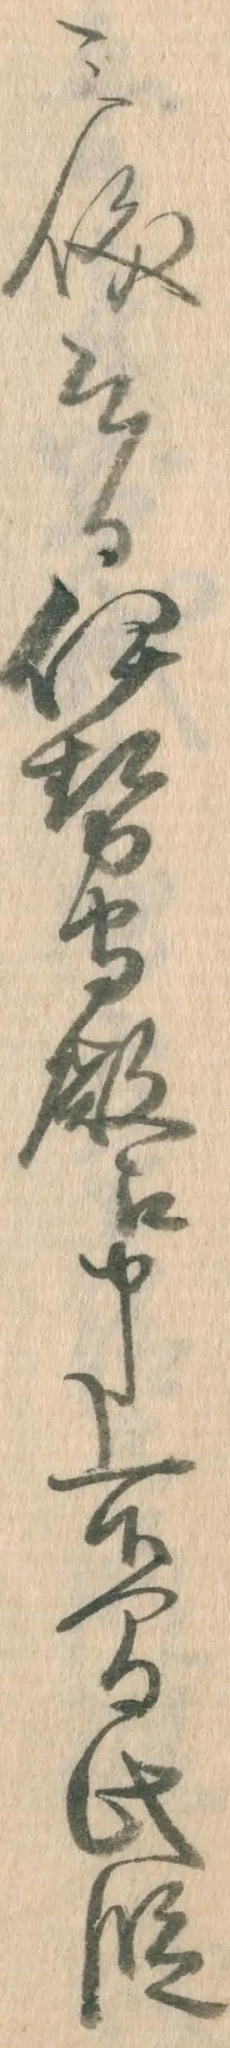之儀今日伊勢守殿え申上候間此段
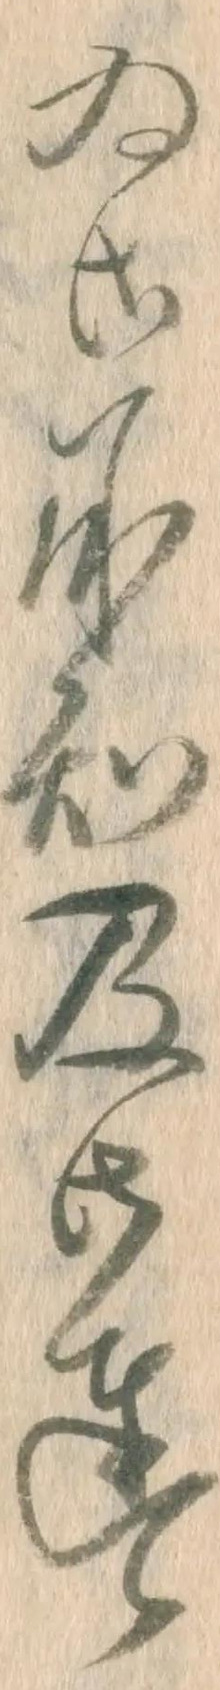為御承知及御達候

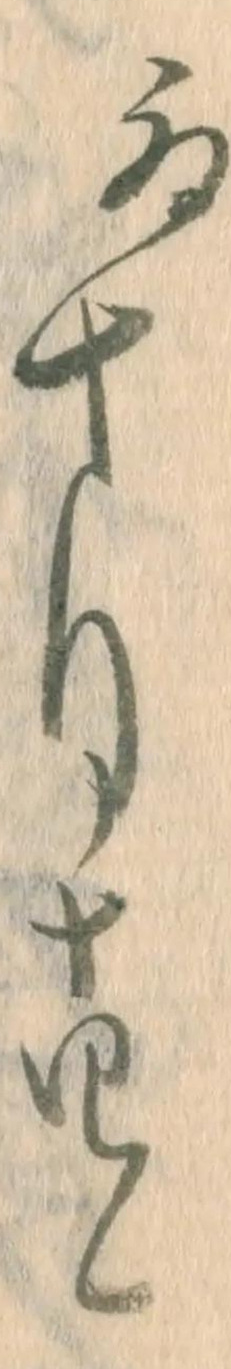卯十月十四日
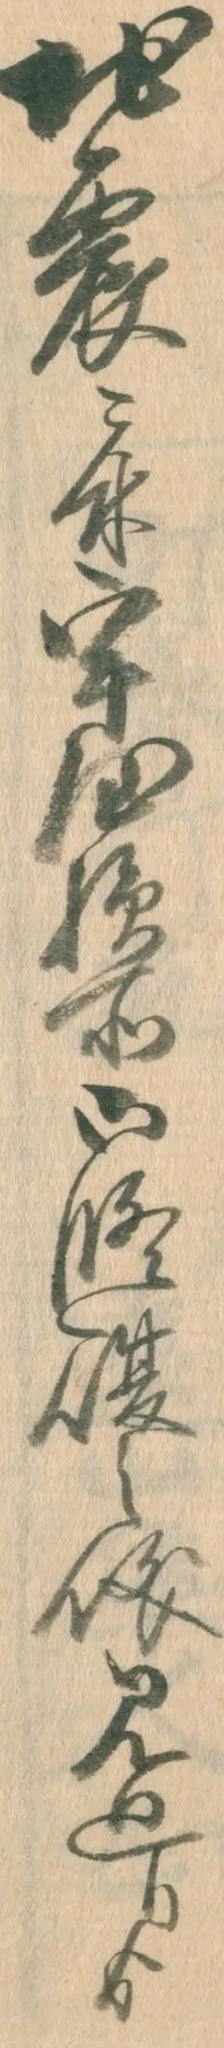地震ニ付牢屋損所御修復之儀見廻りゟ
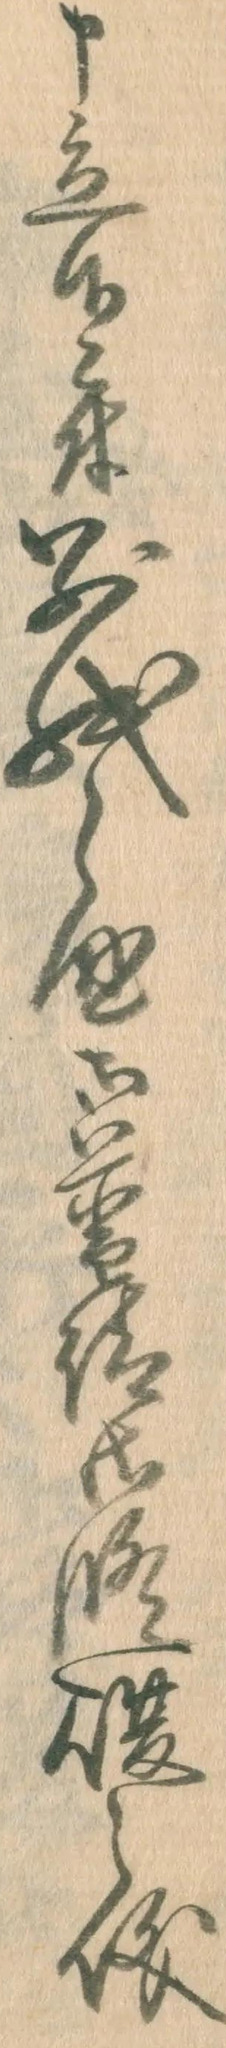申立候ニ付別紙之通り御普請御修復之儀
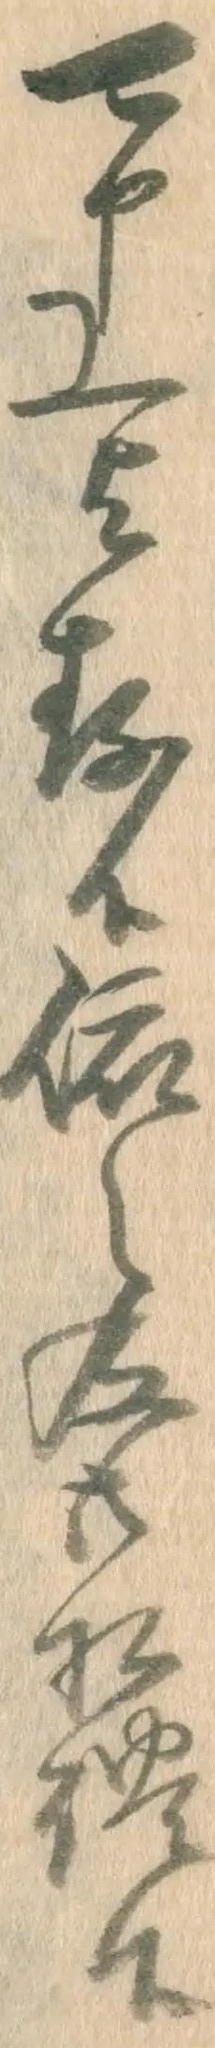可申上と存候依之及御相談候
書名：七十冊物類集 71巻. [44] 四十三 牢屋敷御普請御修覆地震ニ付骨折候牢屋掛御褒美之部
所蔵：国立国会図書館 National Diet Library, JAPAN
